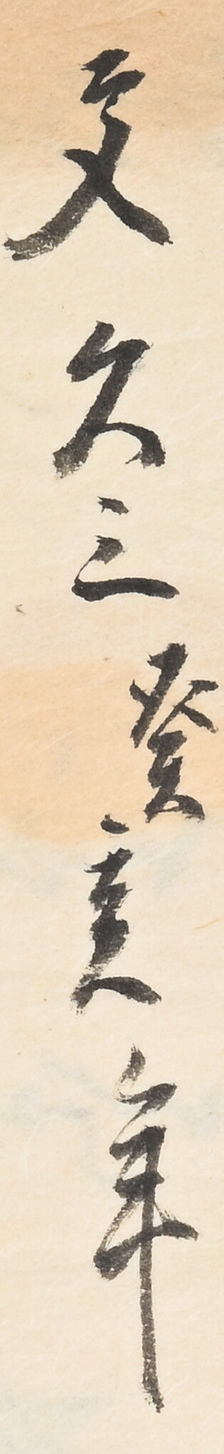文久三癸亥年
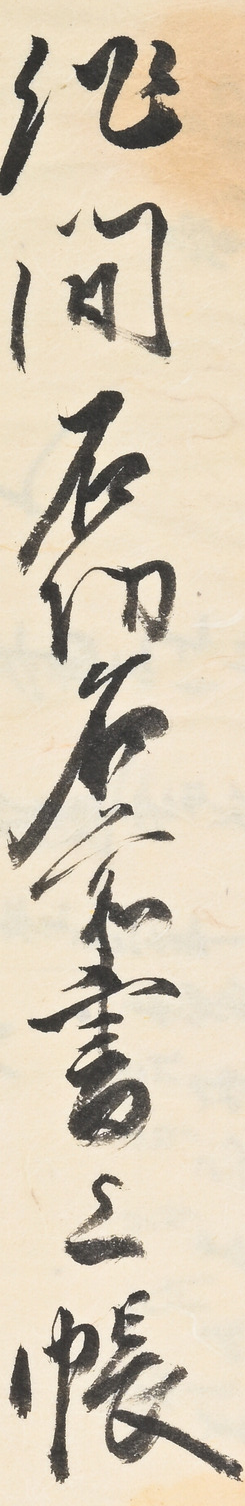作間石切名前書上帳
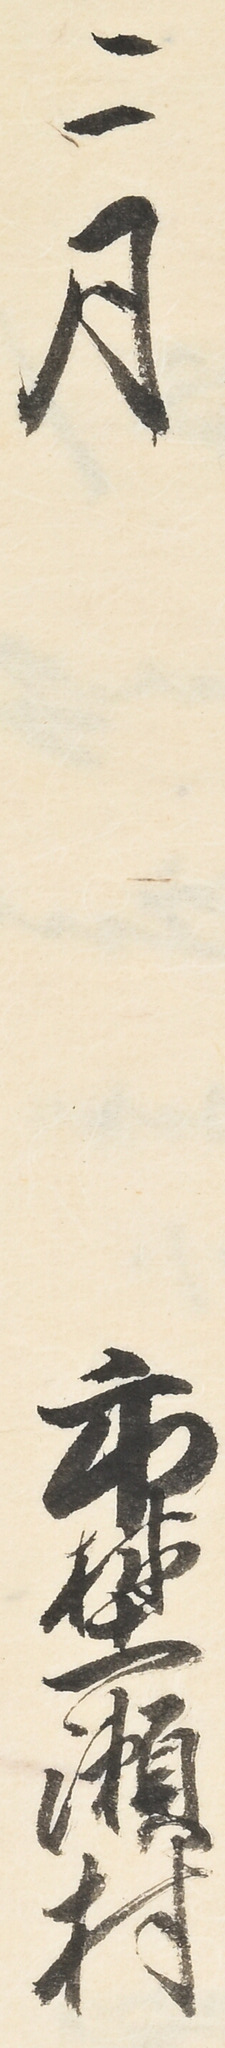二月市野瀬村

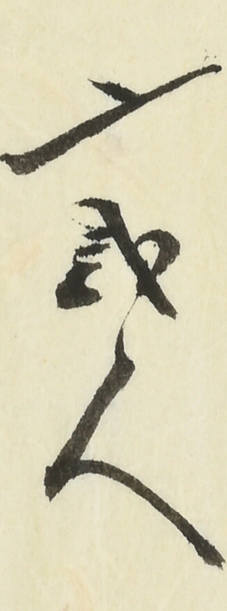〆弐人

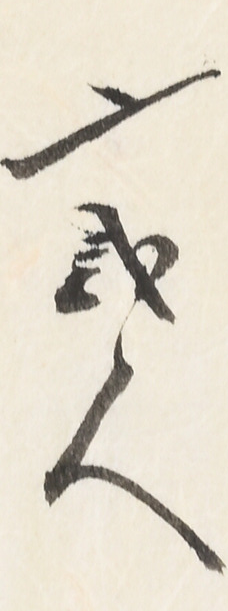〆弐人
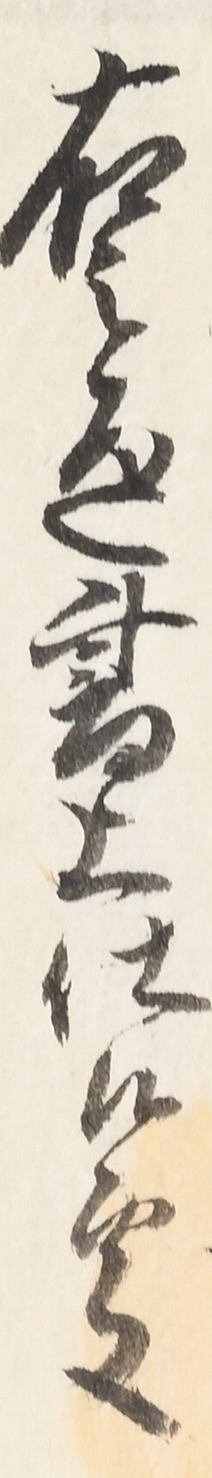右之通書上仕候処
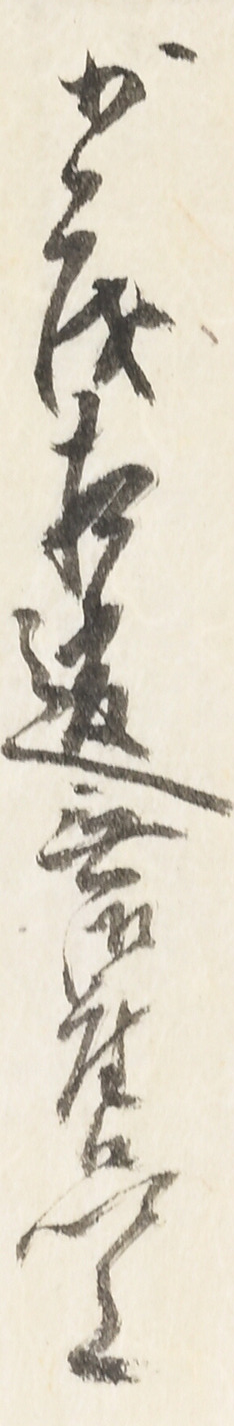少茂相違無御座候以上
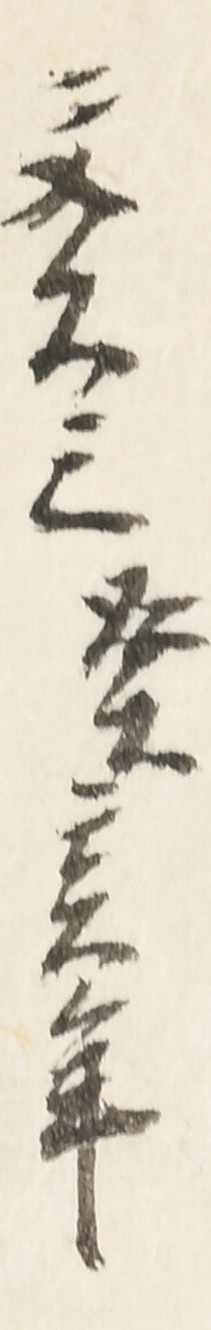文久三癸亥年
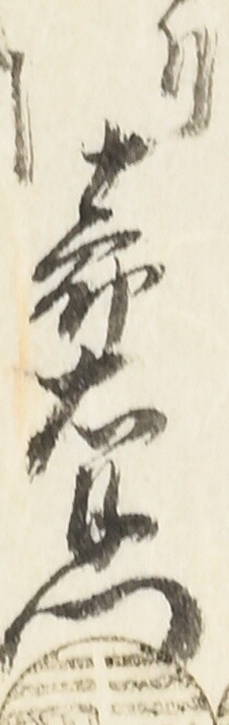嘉右衛門
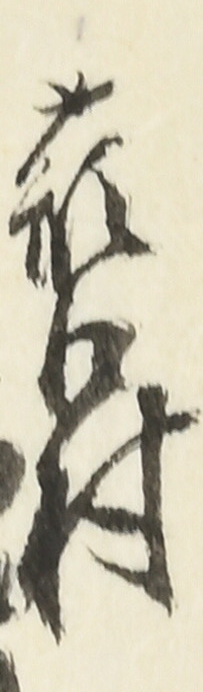荊口村
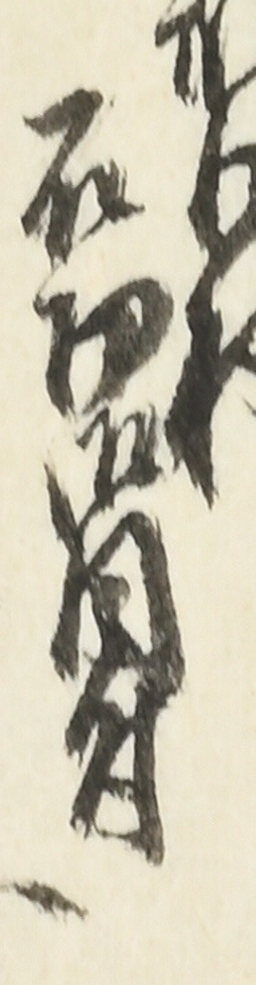石切御目付
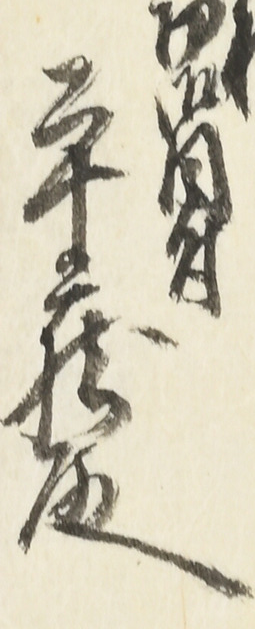平蔵殿
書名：文久三癸亥年二月作間石切名前書上帳
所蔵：伊那市立高遠町図書館・合同会社AMANE
